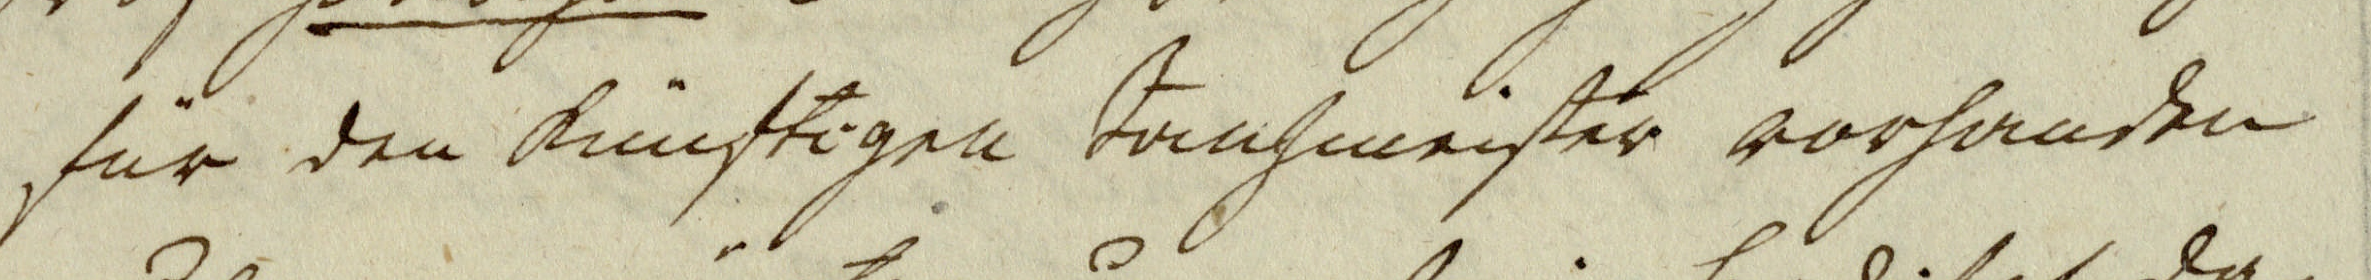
für den künftigen Tanzmeister vorhanden
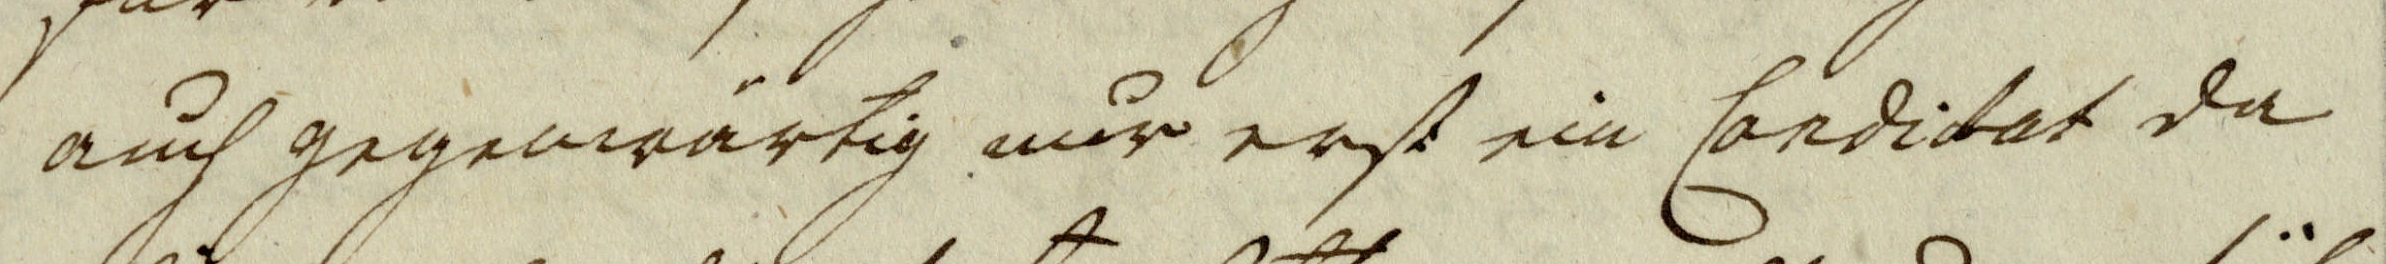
auch gegenwärtig nur erst ein Candidat da
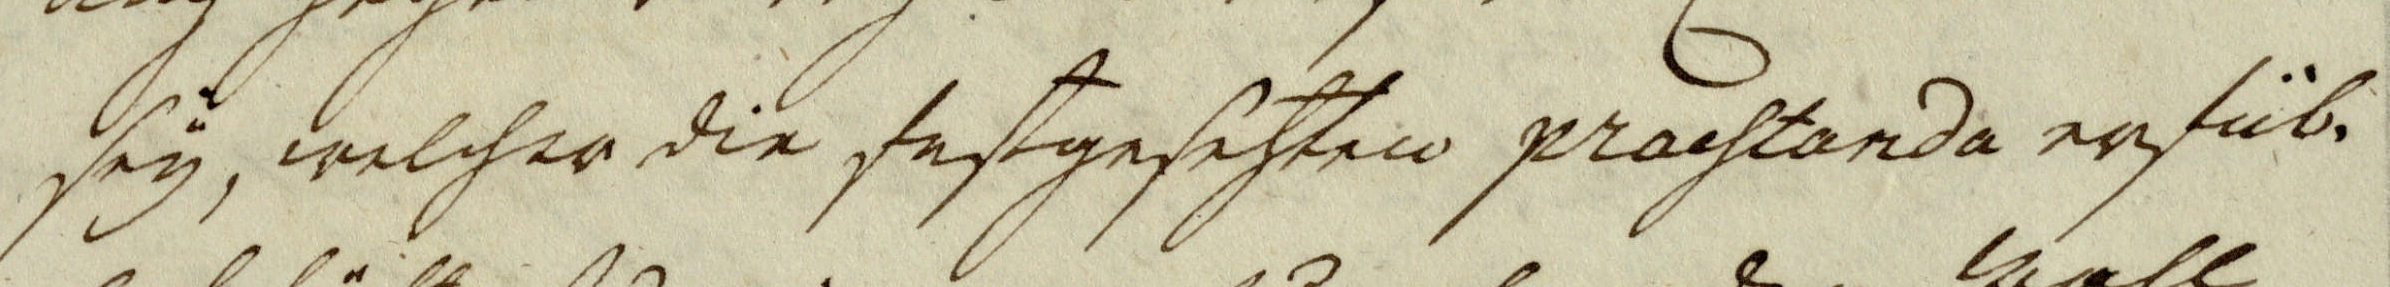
seÿ, welcher die festgesetzten praestanda erfül¬
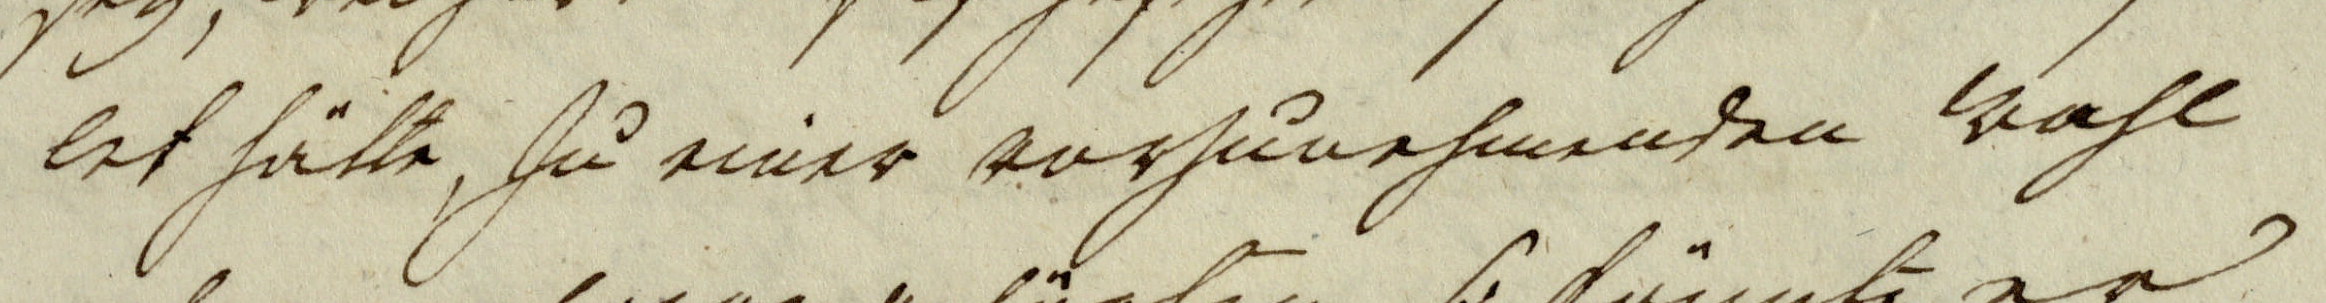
let hätte, zu einer vorzunehmenden Wahl
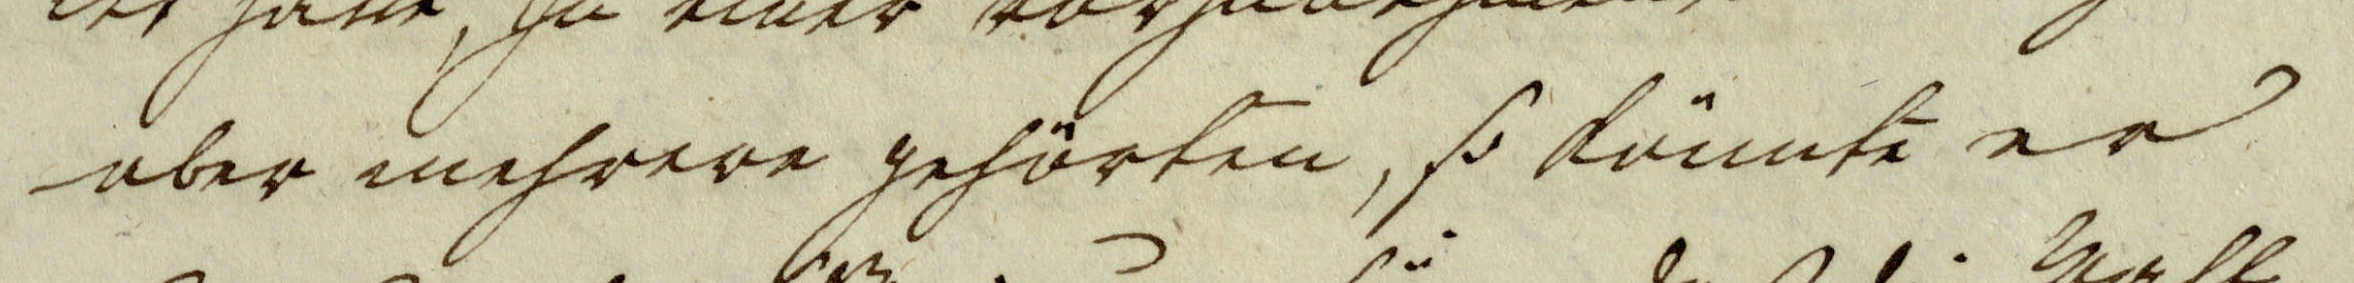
aber mehrere gehörten, so könnte er
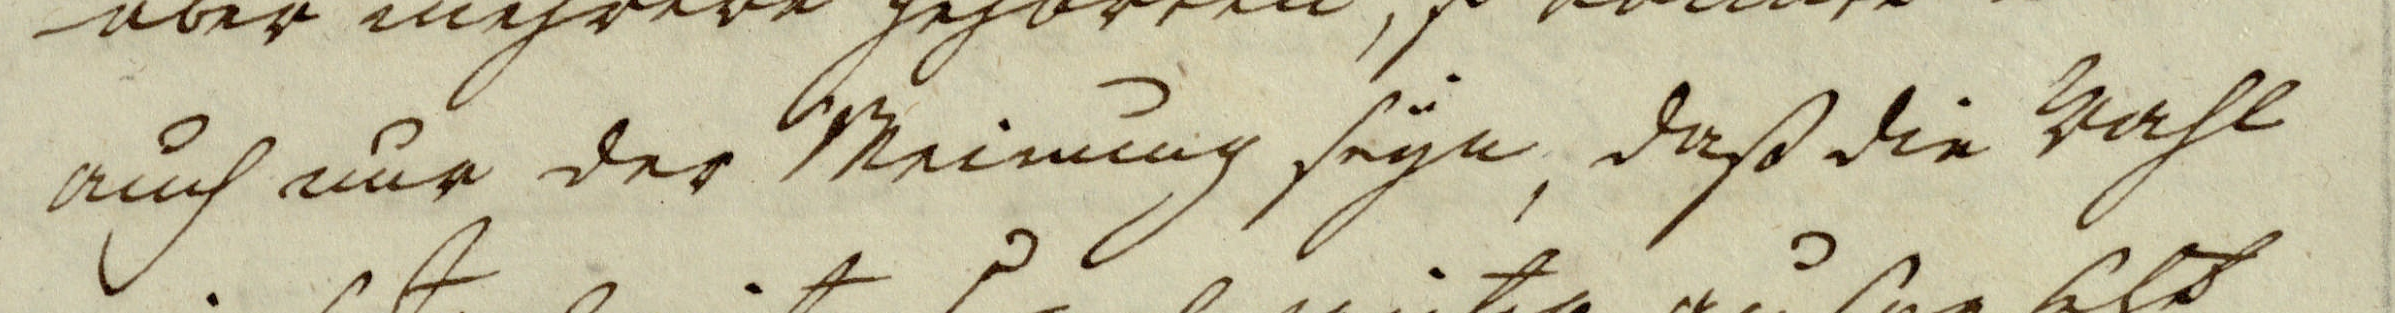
auch nur der Meinung seÿn, daß die Wahl
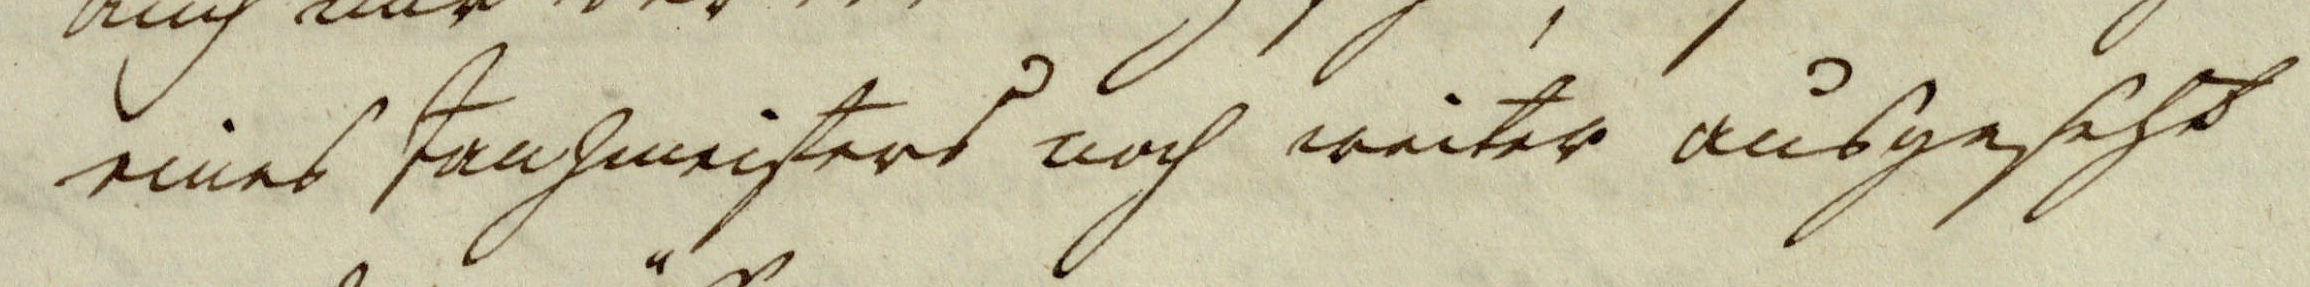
eines Tanzmeisters noch weiter ausgesetzt
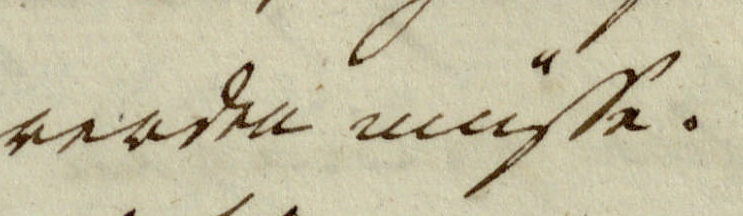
werden müsse.
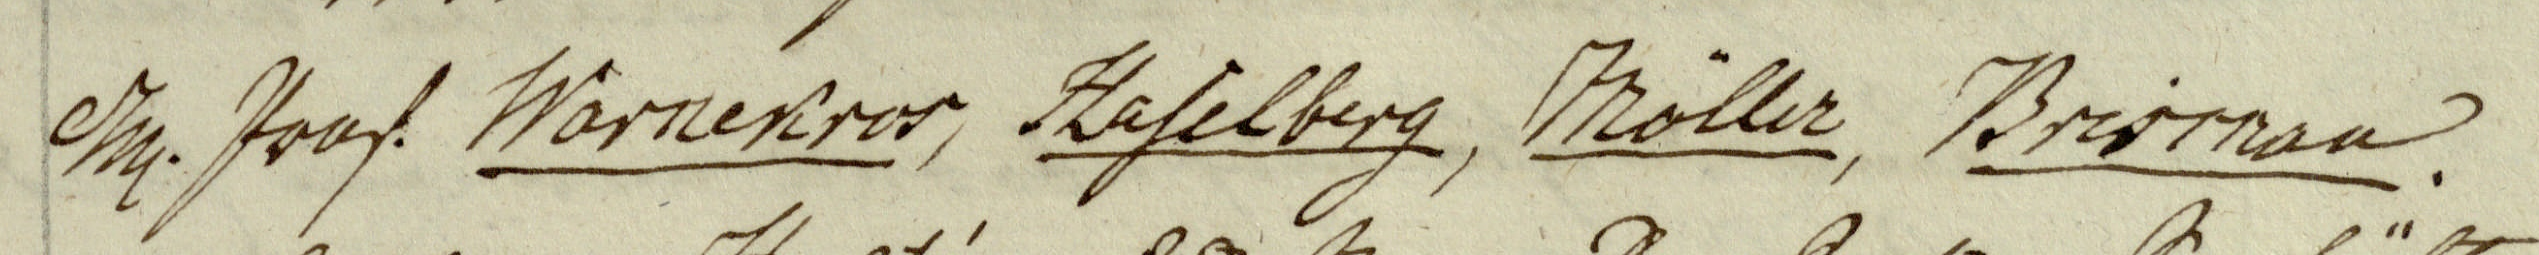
dh. Prof. Warnekros, Haselberg, Möller, Brisman,
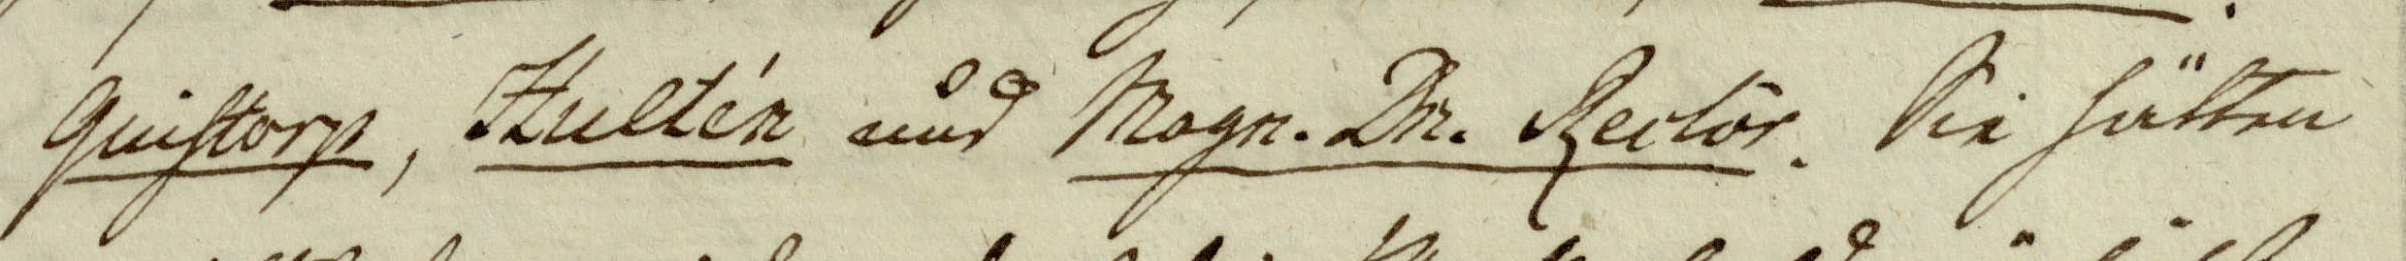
Quistorp, Hultén und Magn. Dn. Rector. Sie hätten
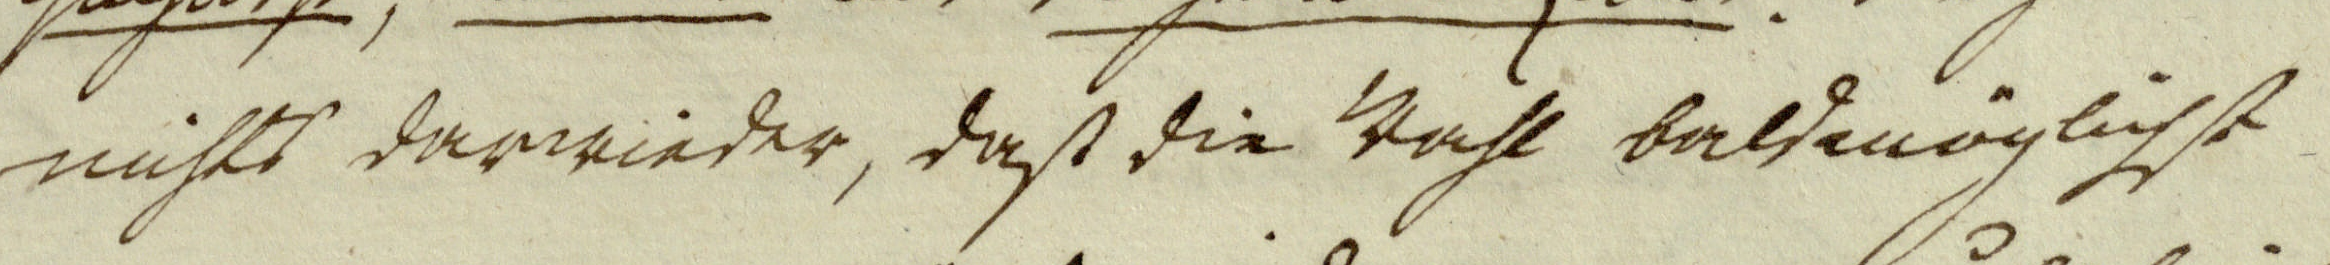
nichts darwieder, daß die Wahl baldmöglichst
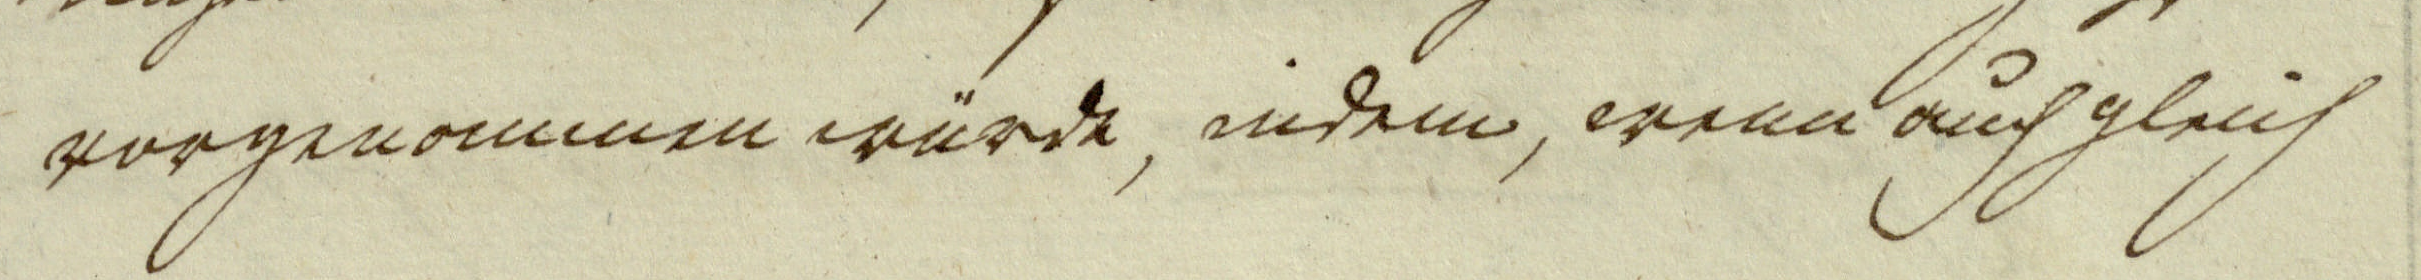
vorgenommen würde, indem, wenn auch gleich
